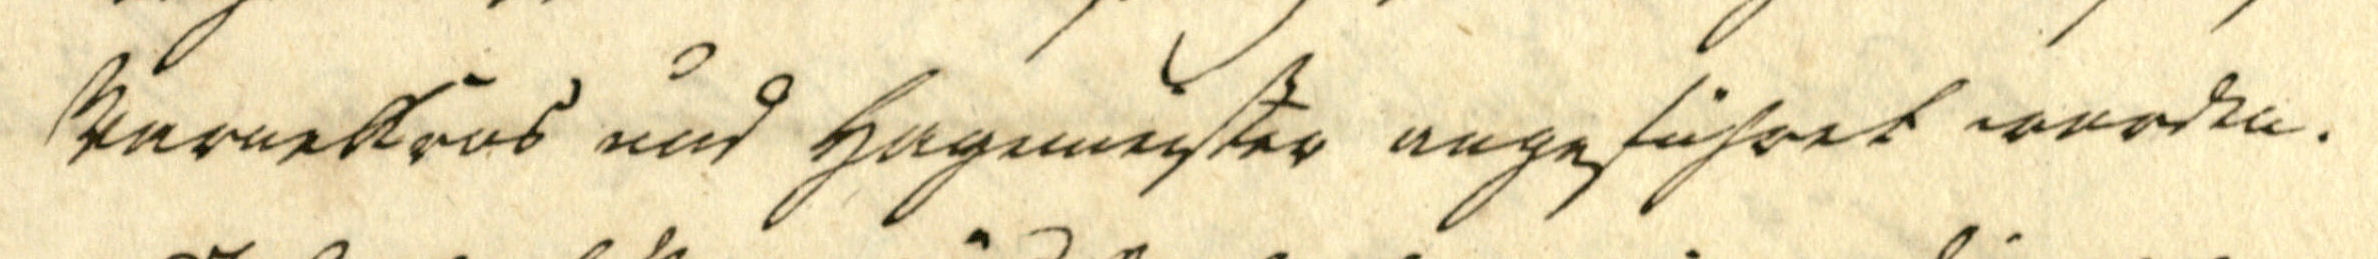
Warnekros und Hagemeister angeführet worden.
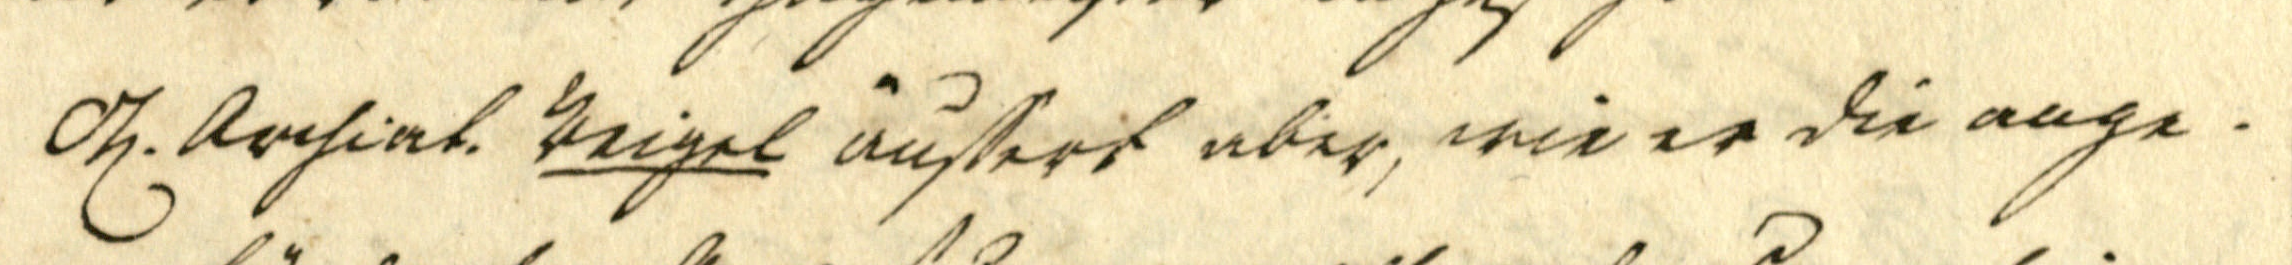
dh. Archiat. Weigel äussert aber, wie er die ange¬
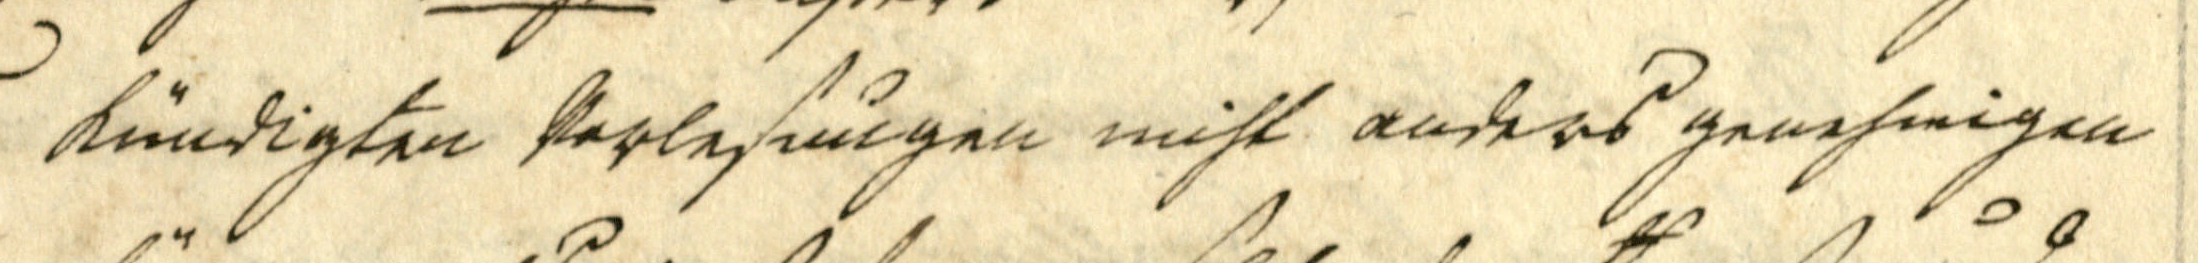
kündigten Vorlesungen nicht anders genehmigen
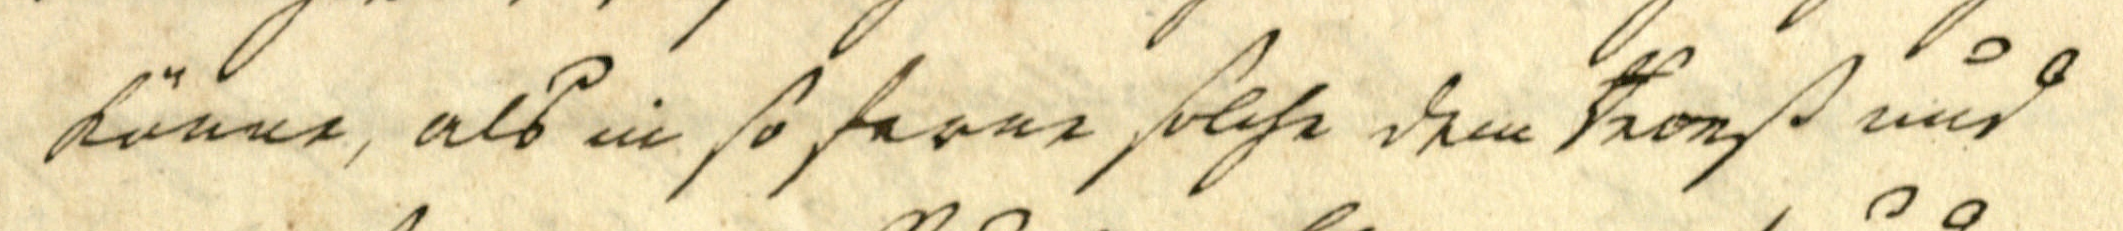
könne, als in so ferne solche dem Receß und
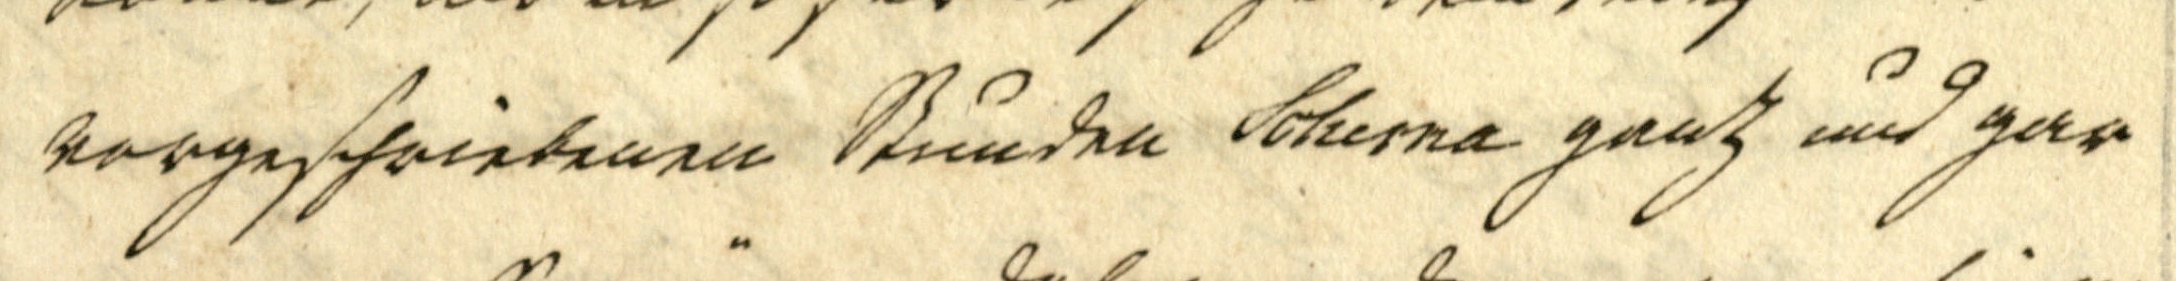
vorgeschriebenen Stunden Schema ganz und gar
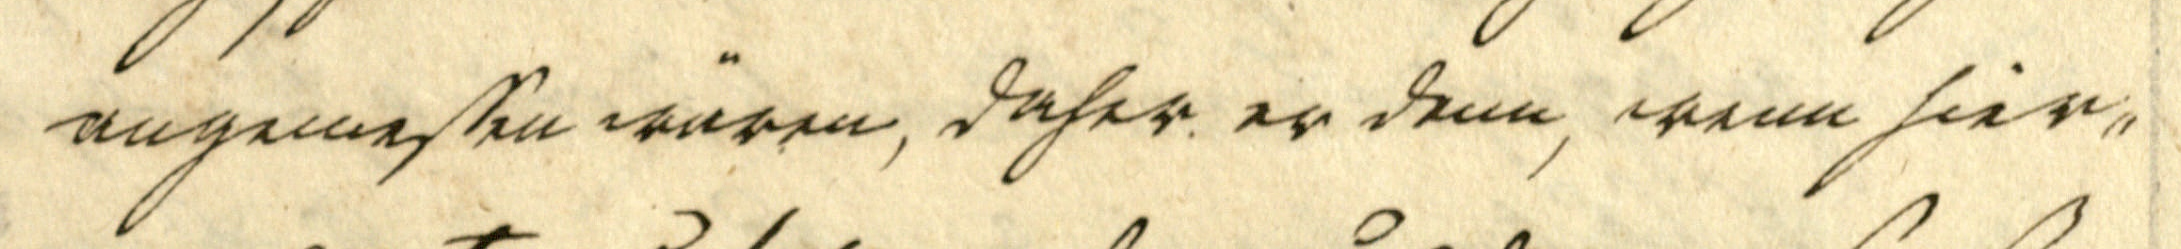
angemessen wären, daher er denn, wenn hier¬
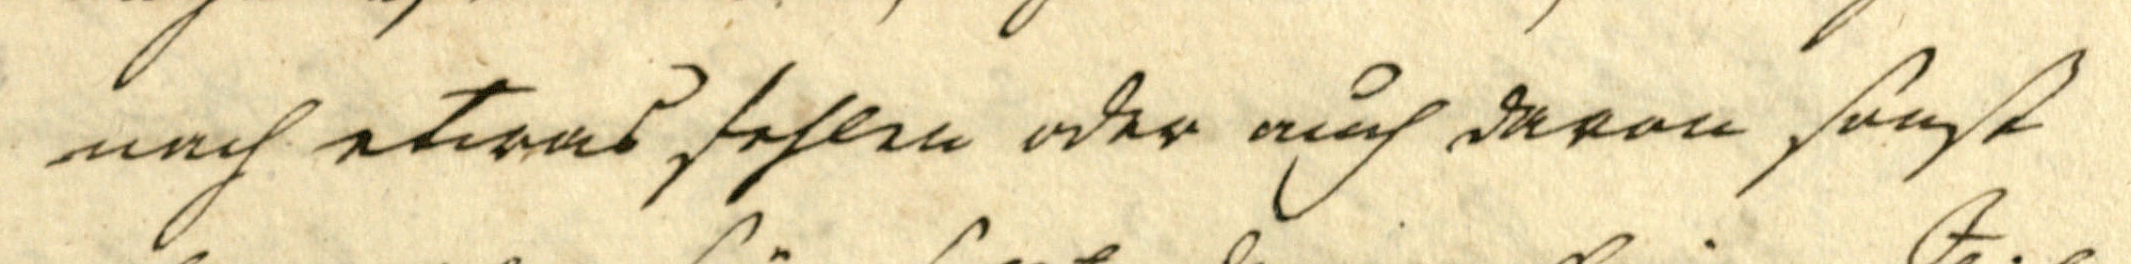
nach etwas fehlen oder auch davon sonst
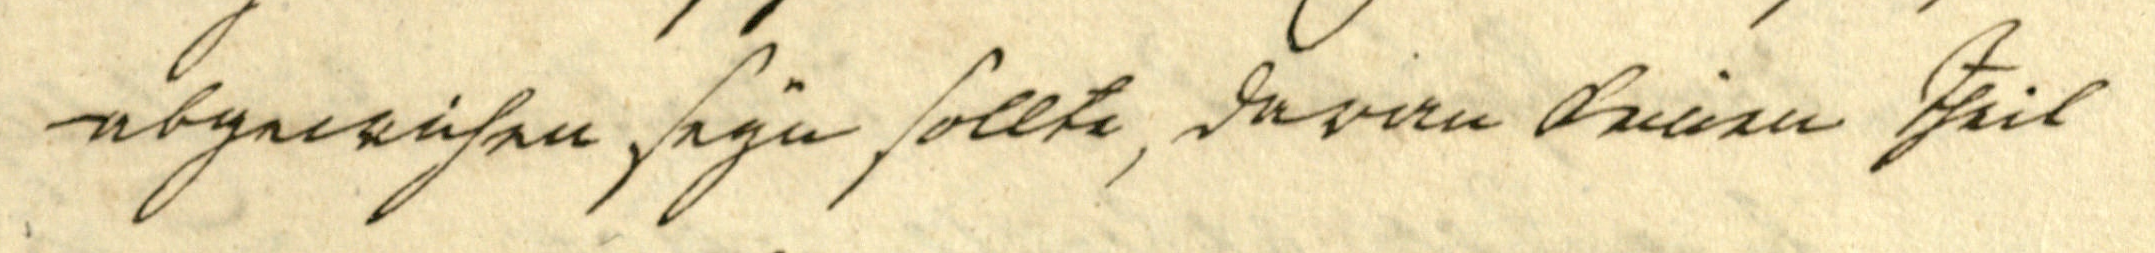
abgewichen seÿn sollte, daran keinen Theil
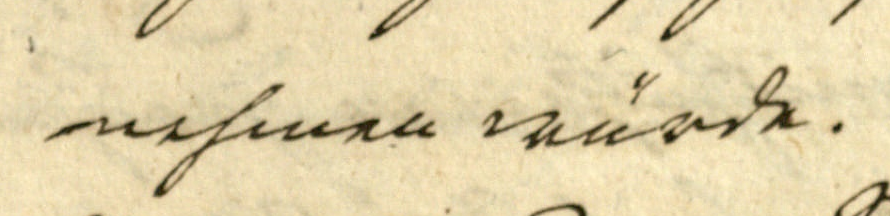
nehmen würde.
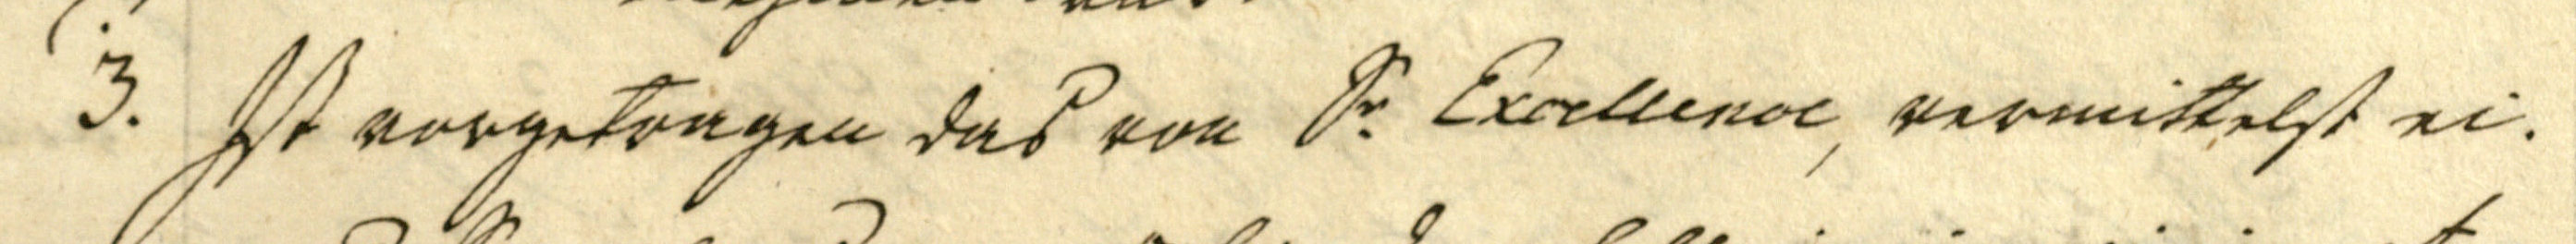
3. Ist vorgetragen das von Sr. Excellence vermittelst ei¬
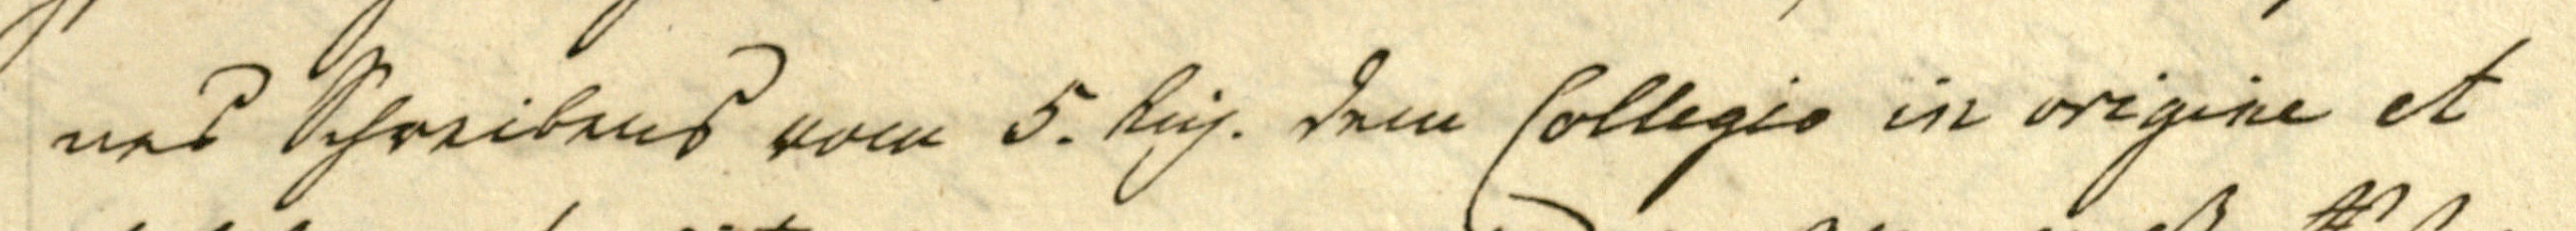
nes Schreibens vom 5. huj. dem Collegio in origine et
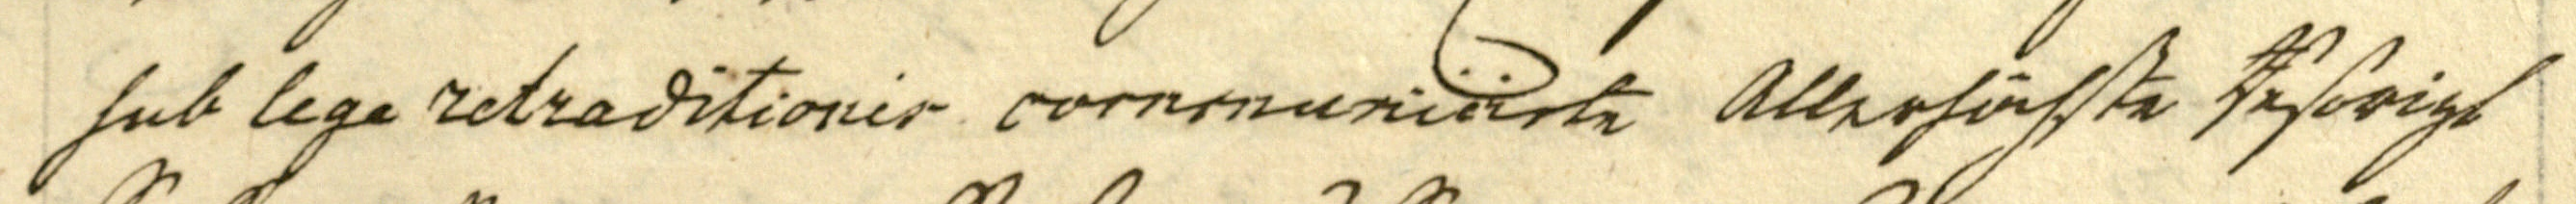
sub lege retraditionis communicirte Allerhöchste Rescript
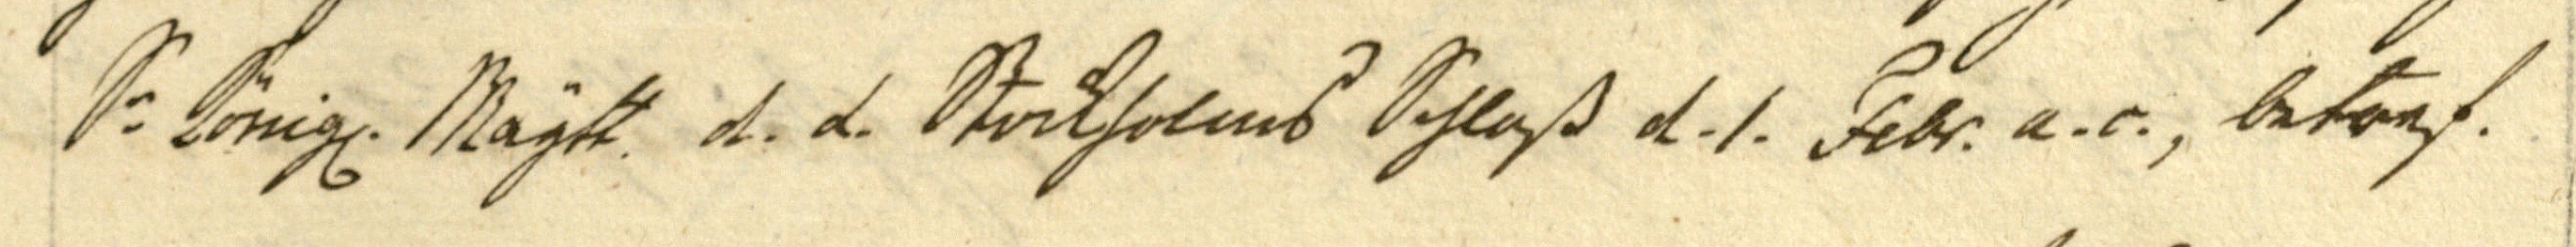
Sr. König. Maÿtt. d. d. Stockholms Schloß d 1. Febr. a. c., betref¬
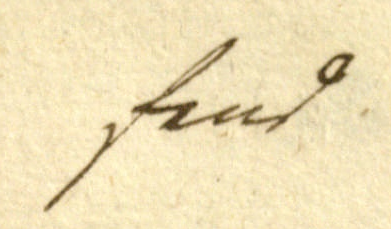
fend
